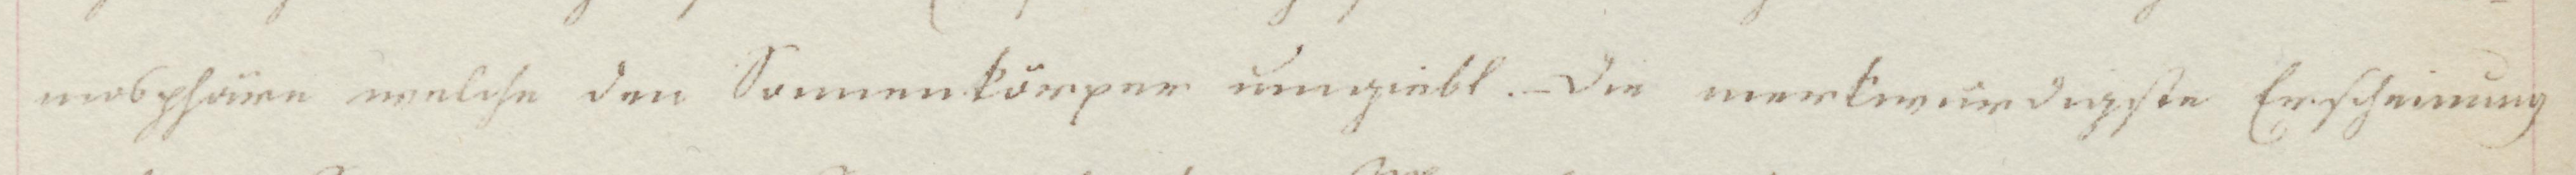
mosphäre welche den Sonnenkörper umgiebt. – Die merkwürdigste Erscheinung
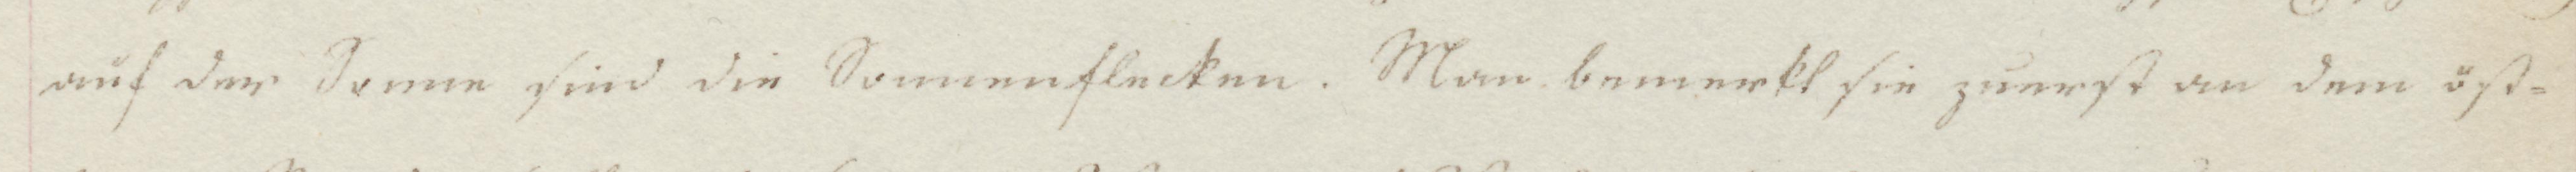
auf der Sonne sind die Sonnenflecken. Man bemerkt sie zuerst an dem öst-
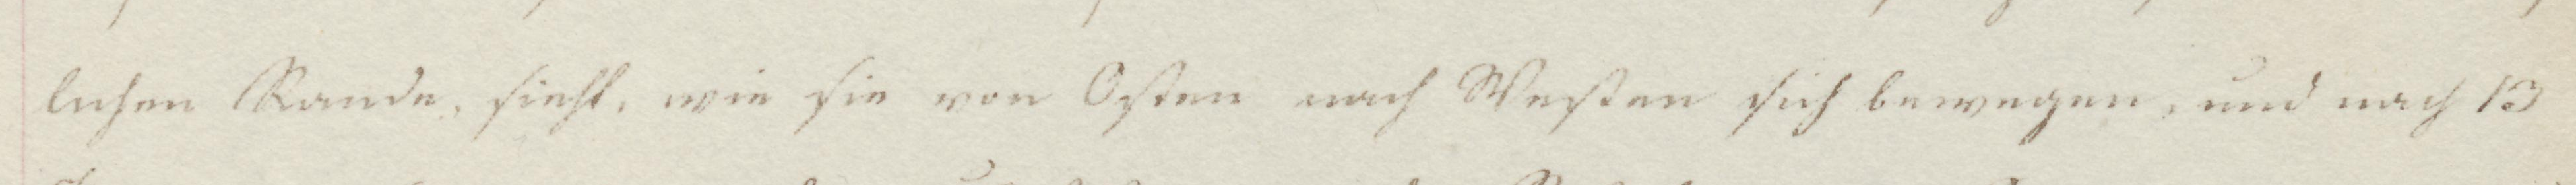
lichen Rande, sieht, wie sie von Osten nach Westen sich bewegen, und nach 13
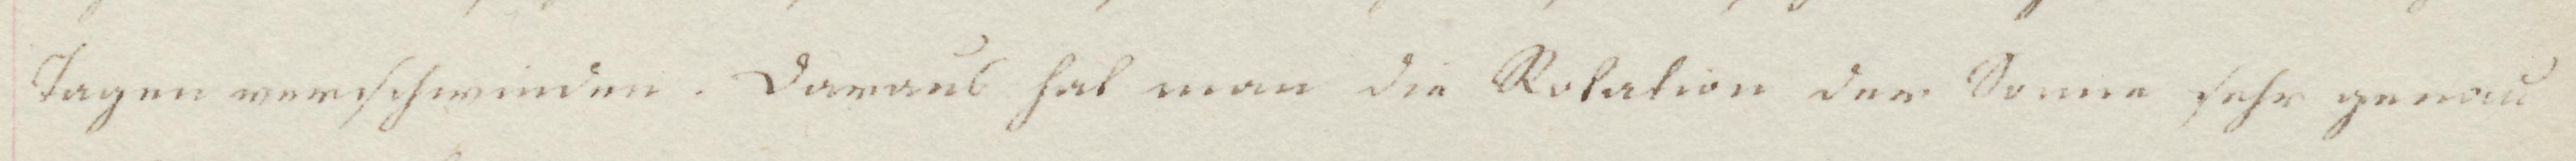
Tagen verschwinden. Daraus hat man die Rotation der Sonne sehr genau
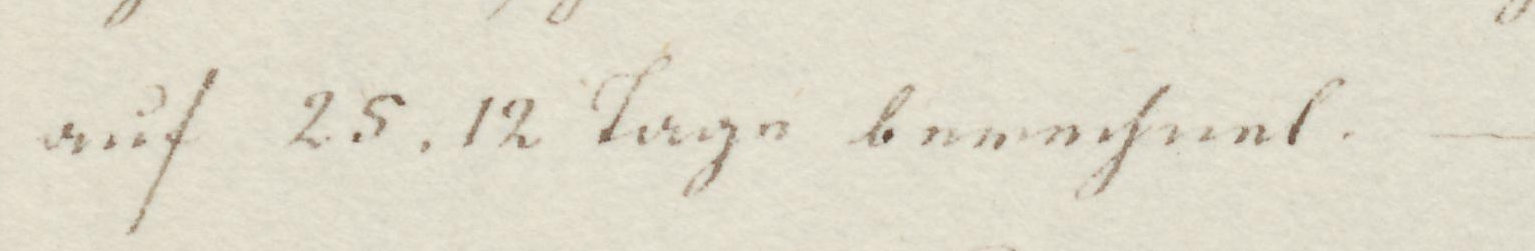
auf 25,12 Tage berechnet. –
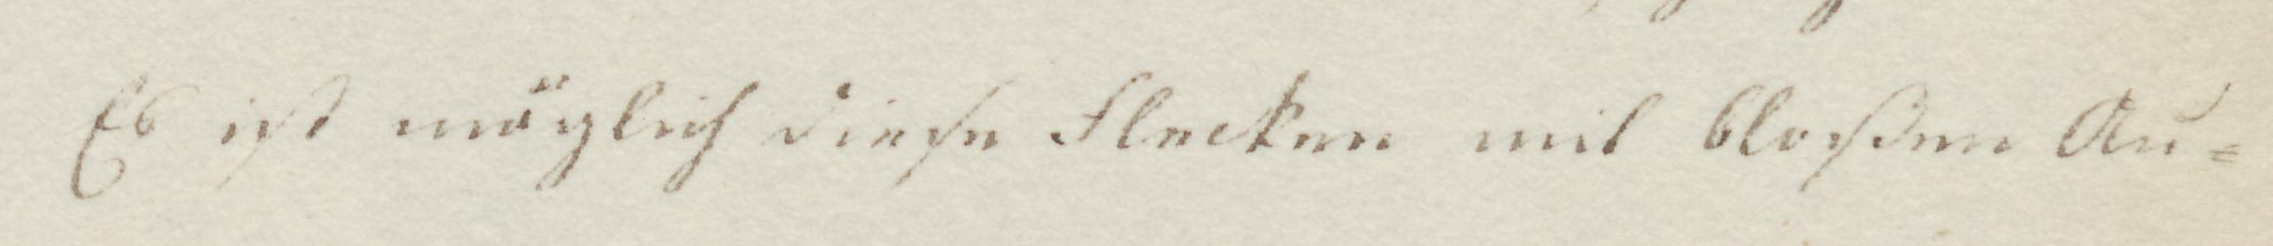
Es ist möglich diese Flecken mit bloßen Au-
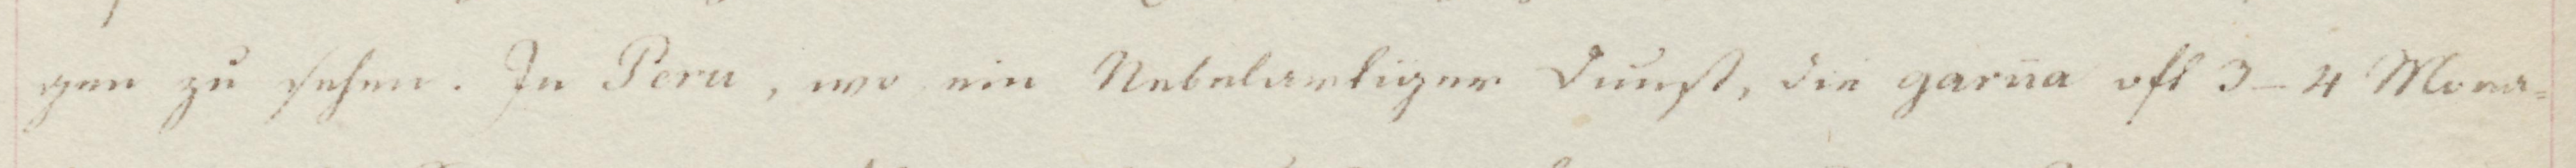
gen zu sehen. In Peru, wo ein Nebelartiger Dunst, die garña oft 3–4 Mona-
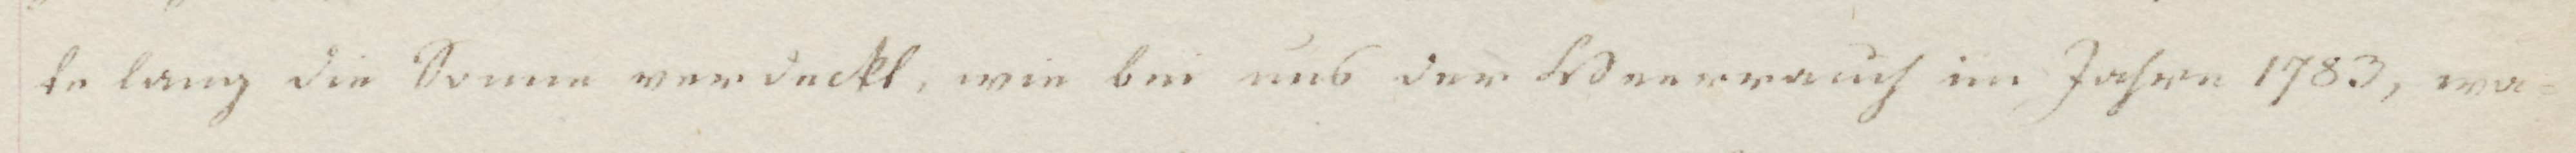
te lang die Sonne verdeckt, wie bei uns der Heerrauch im Jahre 1783, wa-
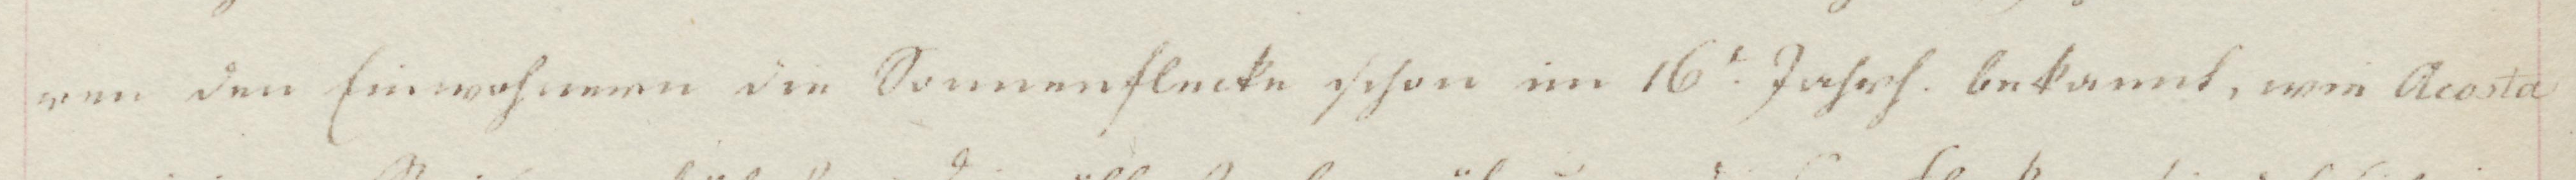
ren den Einwohnern die Sonnenflecke schon im 16t￼ Jahrh. bekannt, wie Acosta
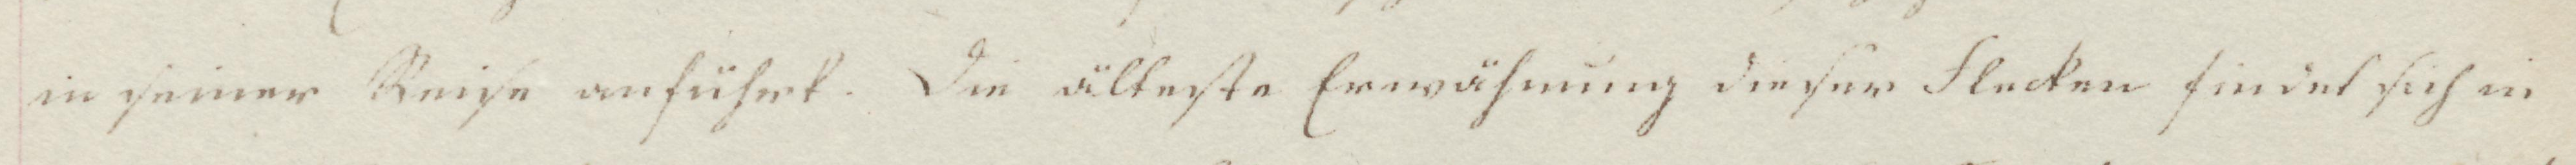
in seiner Reise anführt. Die älteste Erwähnung dieser Flecken findet sich in
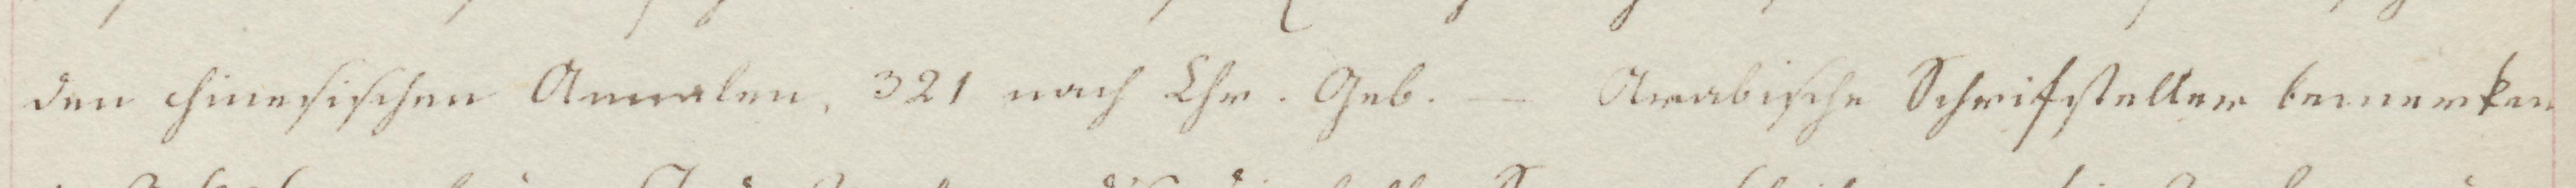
den chinesischen Annalen, 321 nach Chr. Geb. – Arabische Schriftsteller bemerken,
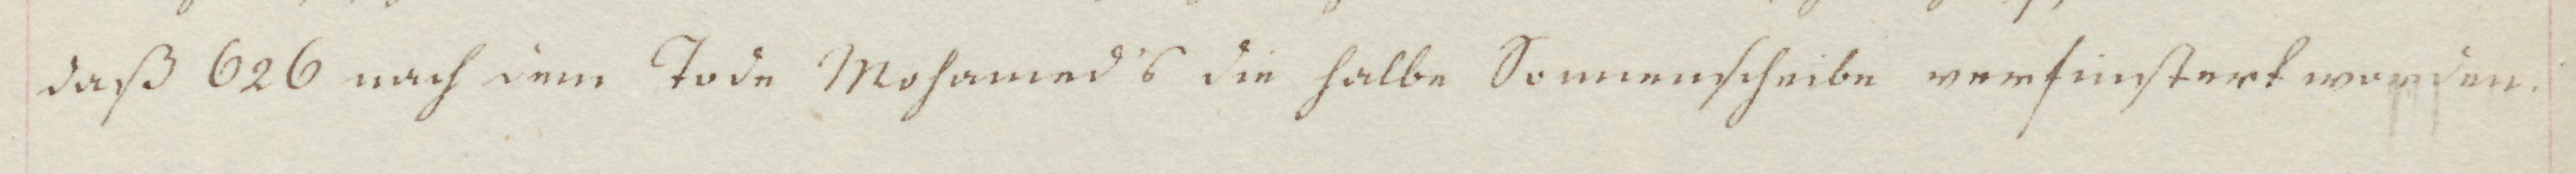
daß 626 nach dem Tode Mohamed's die halbe Sonnenscheibe verfinstert worden.
